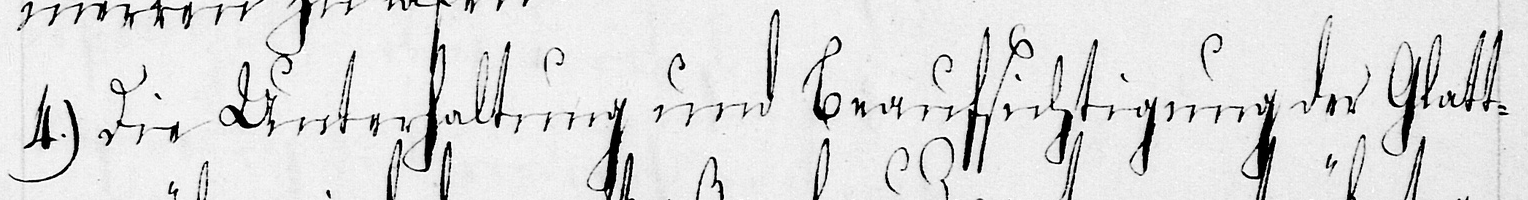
4.) Die Unterhaltung und Beaufsichtigung der Glatt¬
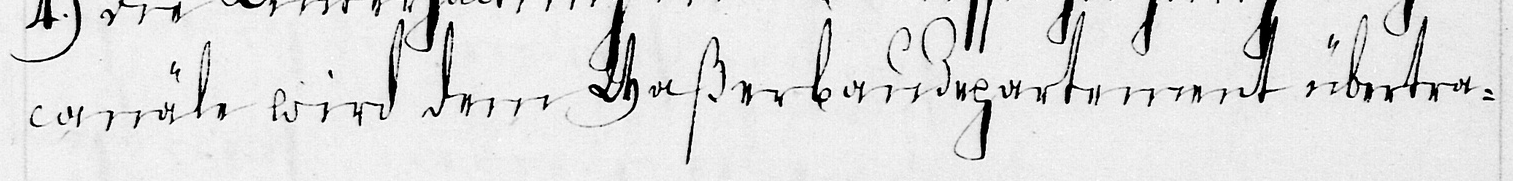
canäle wird dem Waßerbaudepartement übertra¬
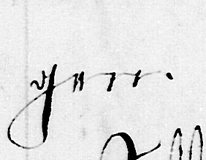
gen.
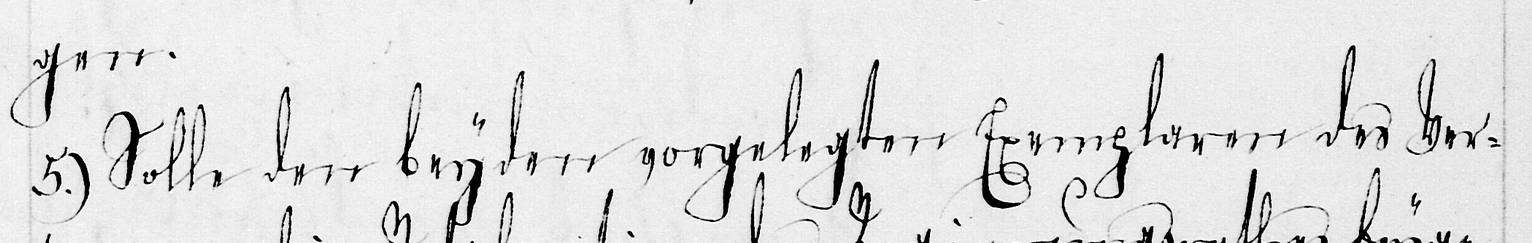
5.) Solle den beyden vorgelegten Exemplaren des Ver¬
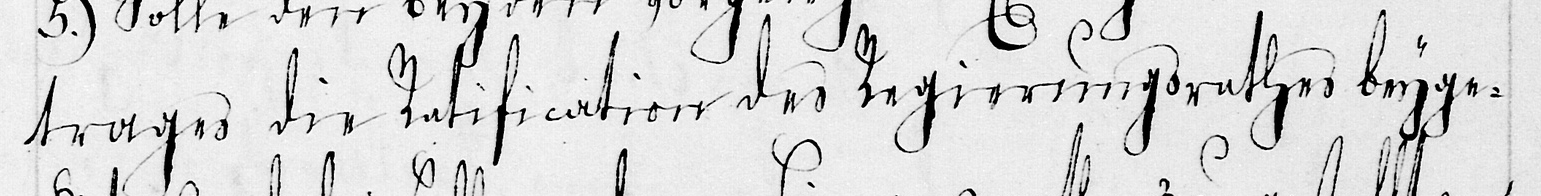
trages die Ratification des Regierungsrathes beyge¬
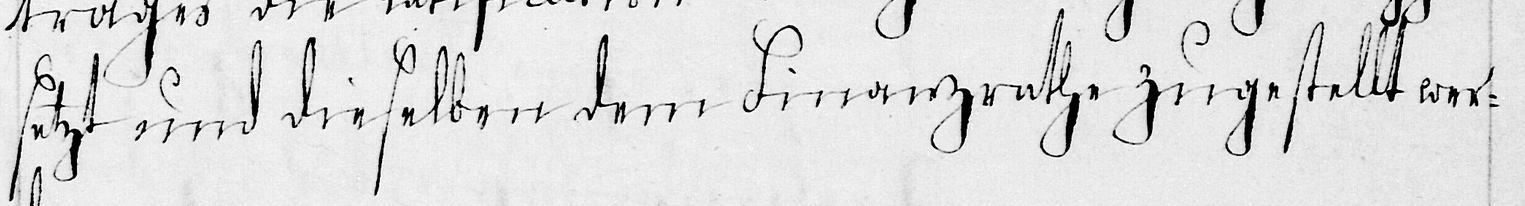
setzt und dieselben dem Finanzrathe zugestellt wer¬
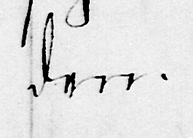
den.
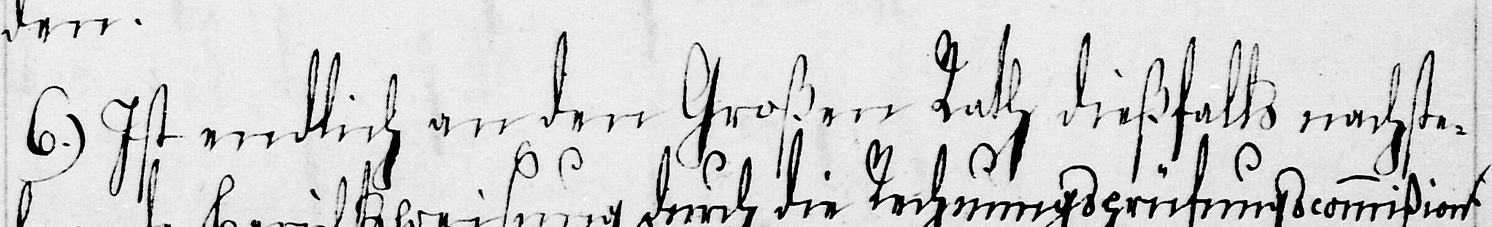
6.) Ist endlich an den Großen Rath dießfalls nachst¬
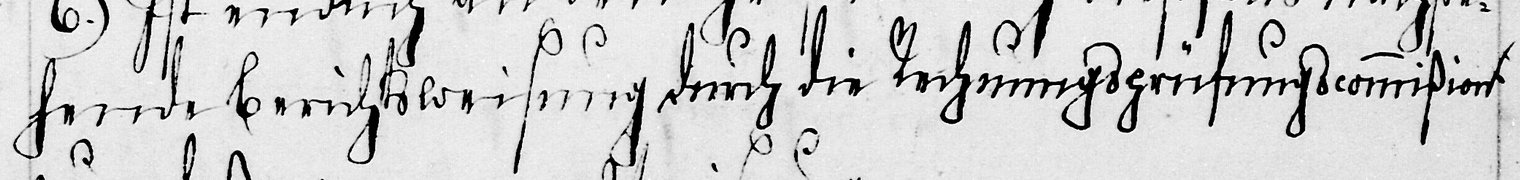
ehende Berichtsweisung durch die Rechnungsprüfungscommißion
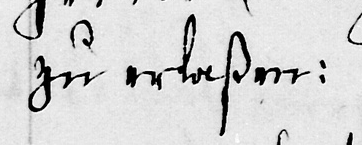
zu erlaßen:
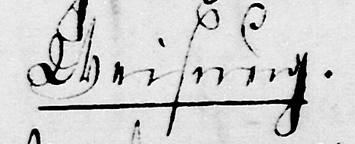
Weisung.
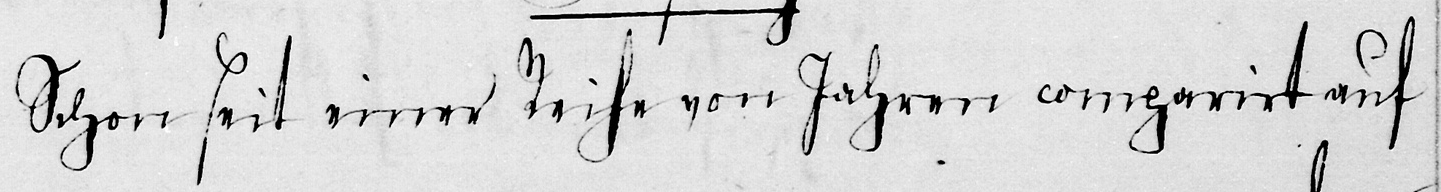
Schon seit einer Reihe von Jahren comparirt auf
